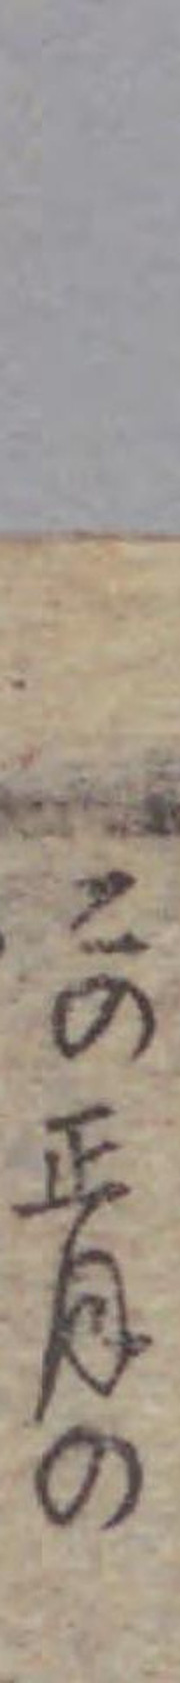この正月の
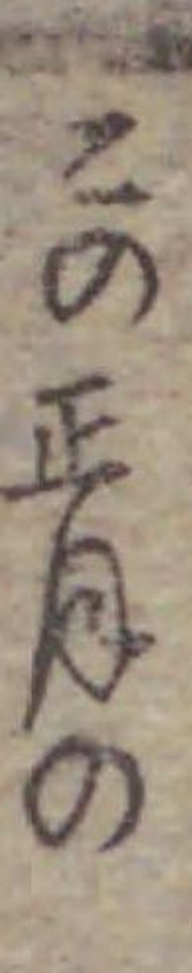この正月の
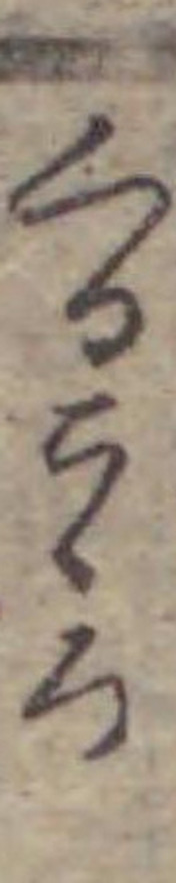くるこゝろ
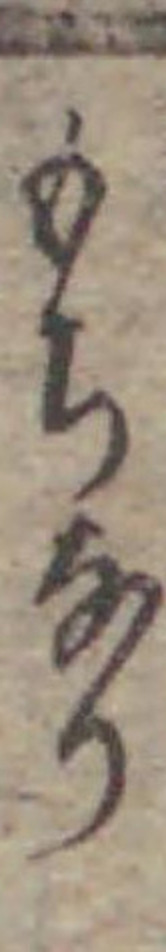もちなり
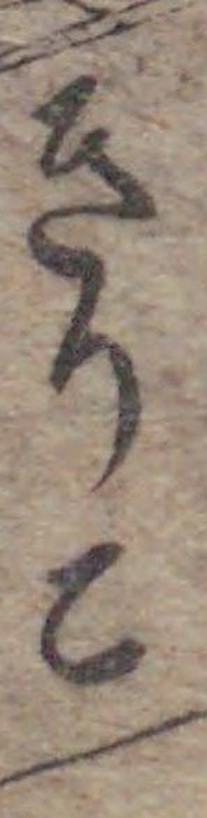きりこ

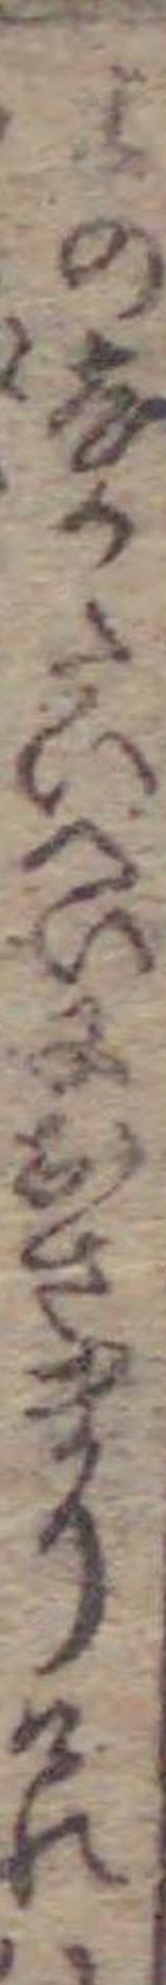よもなかたいへいにおさまりけれは
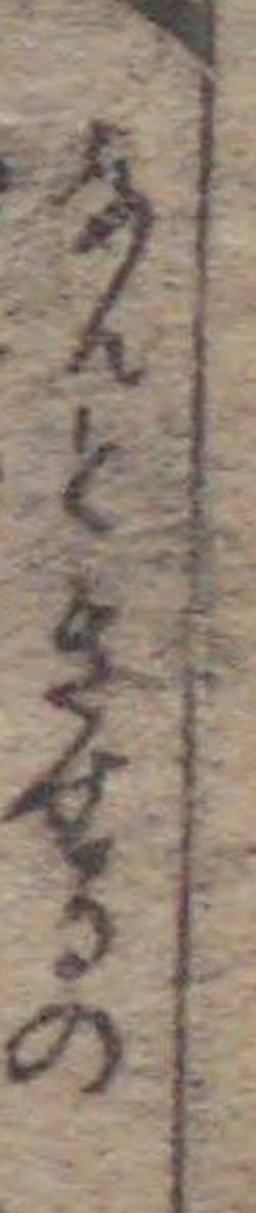なんとさせるの
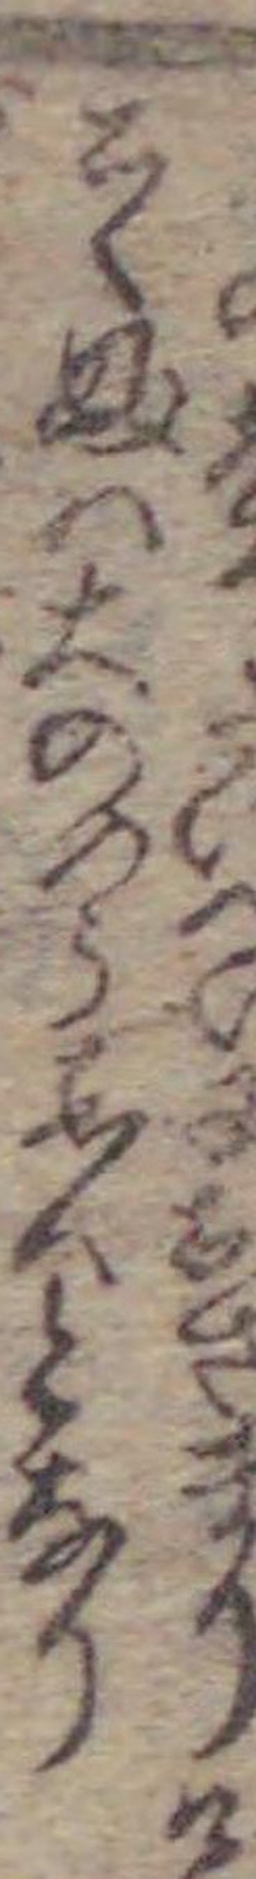こくふは大のつうしんとなり
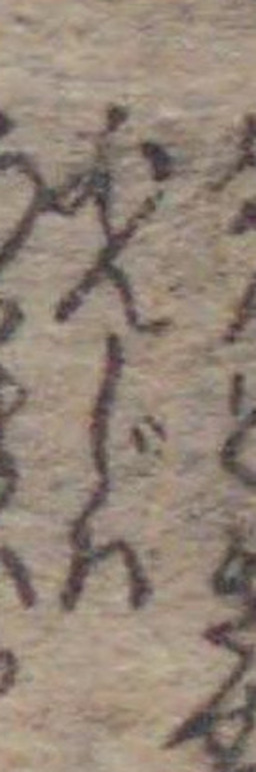あんじは
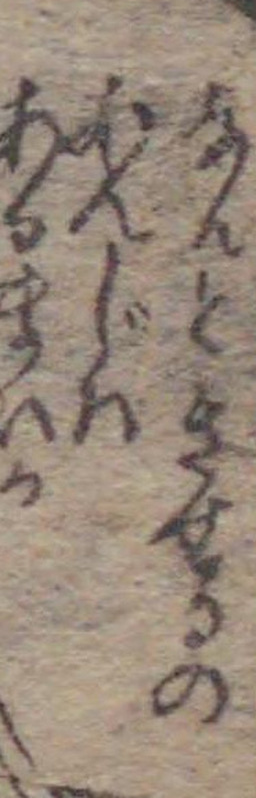あるまいか
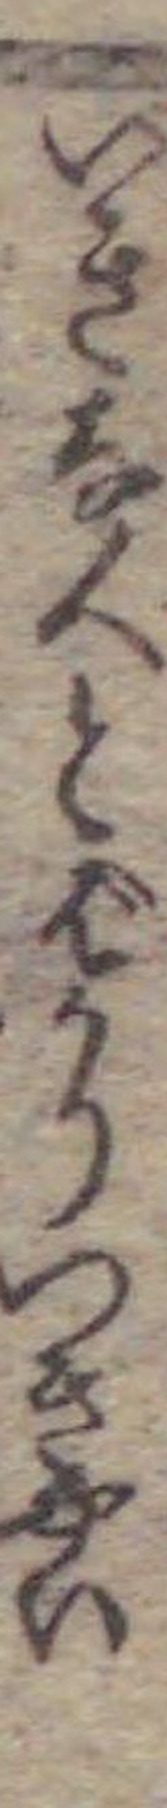いきな人とばかりつきやい
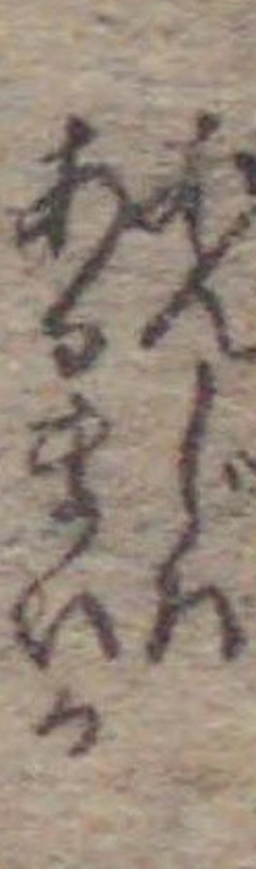あるまいか
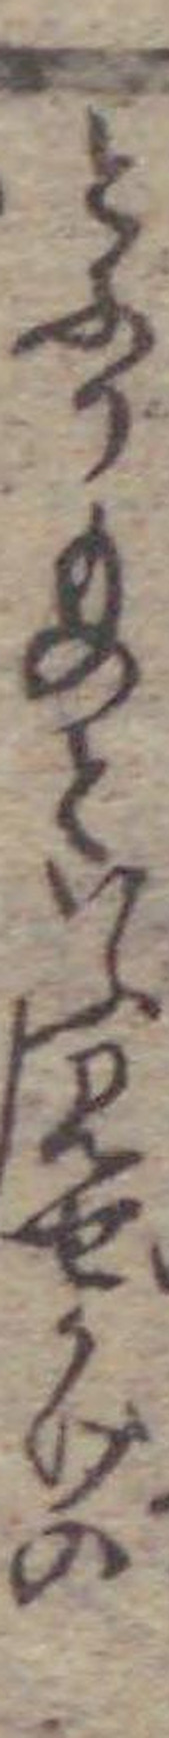とふかものといふみせかけの
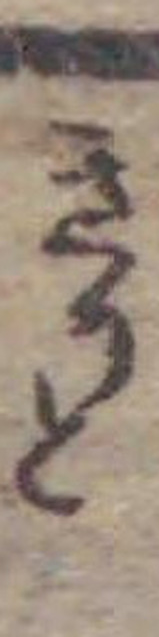きりと
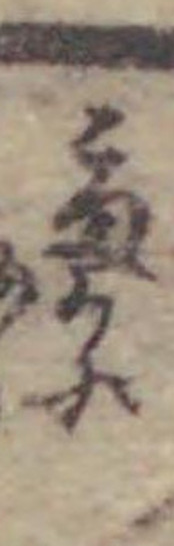こまかに
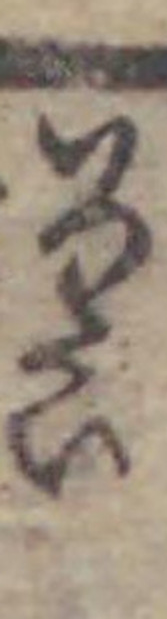いつたい
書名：談芭菰誉詞 : 3巻
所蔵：国立国会図書館 National Diet Library, JAPAN
